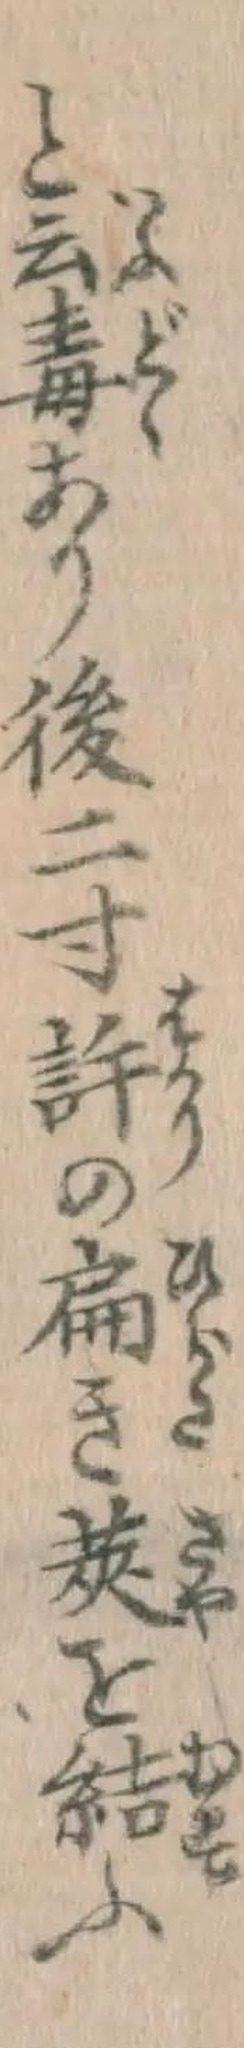と云毒あり後二寸許の扁き莢を結ふ

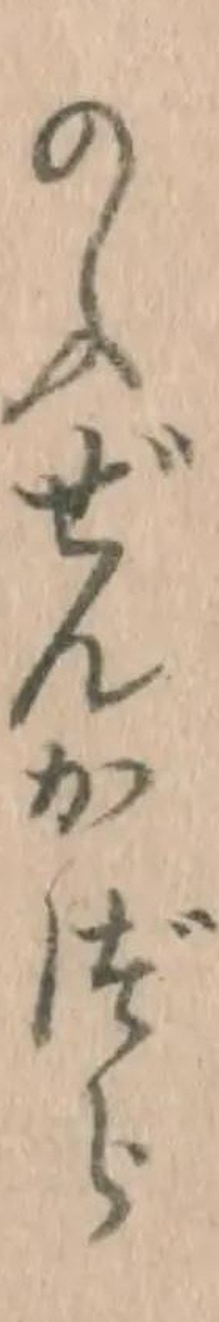のふぜんかづら

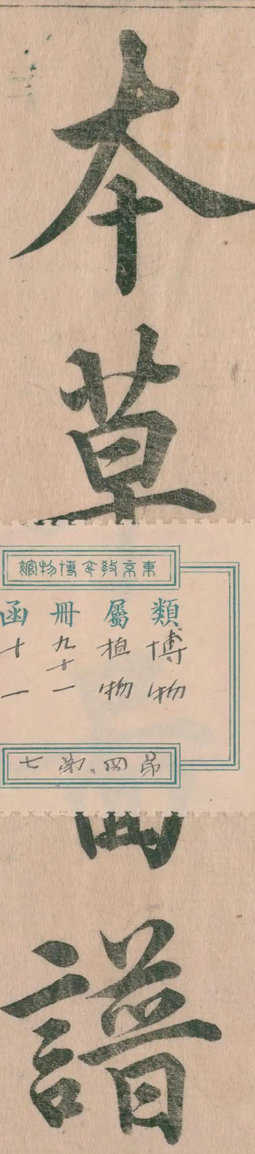本草図譜
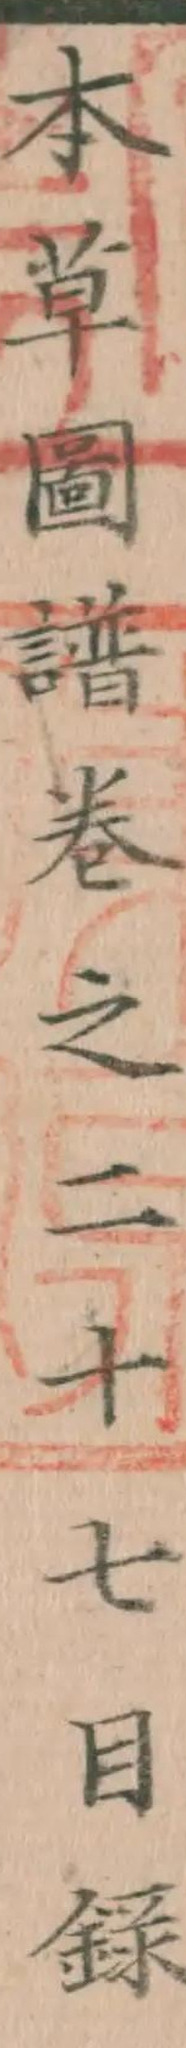本草図譜巻之二十七目録
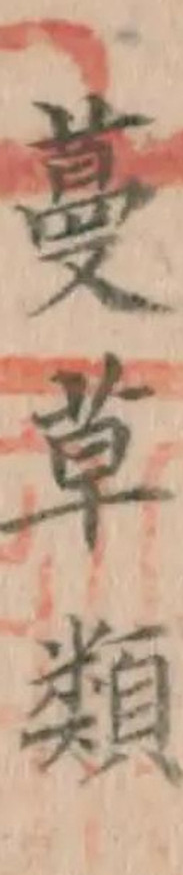蔓草類
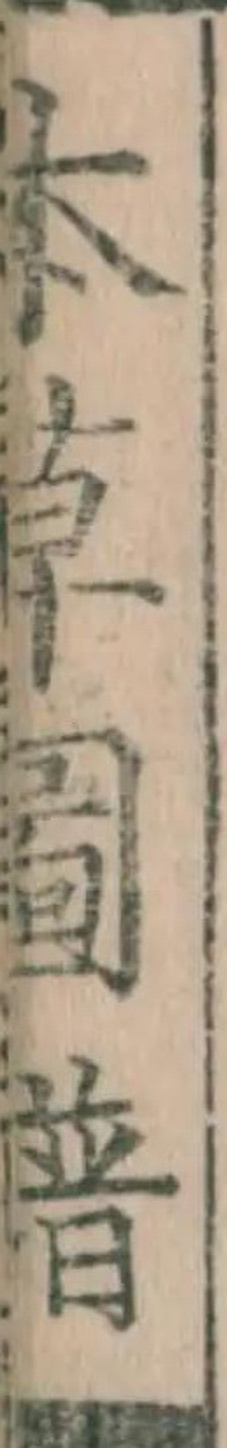本草図譜

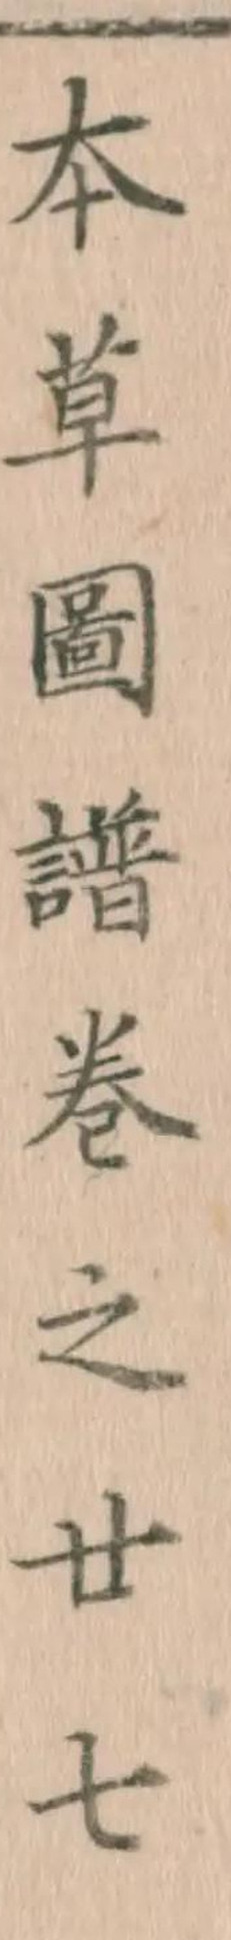本草図譜巻之廿七
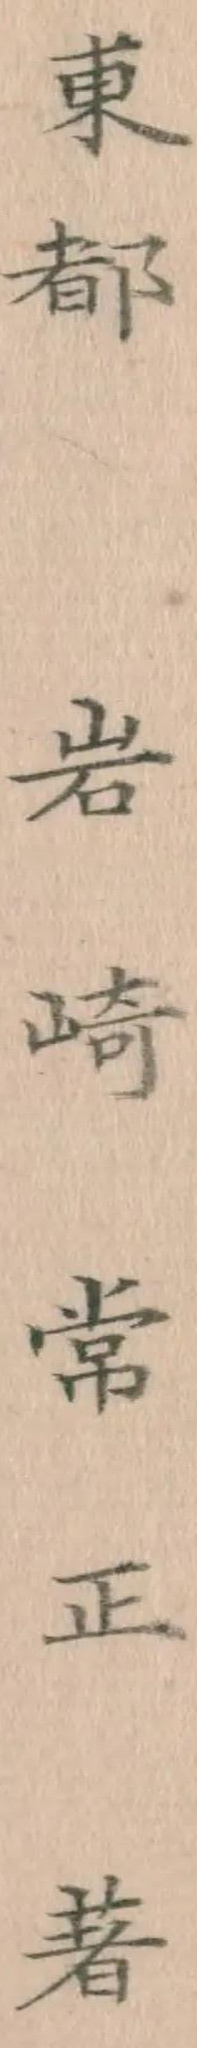東都岩崎常正著
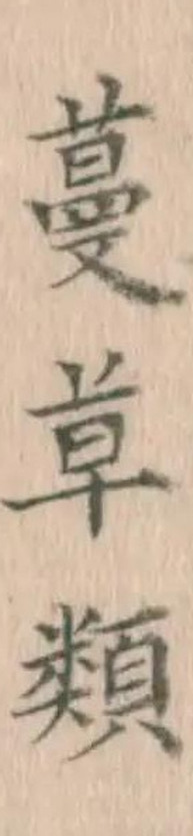蔓草類

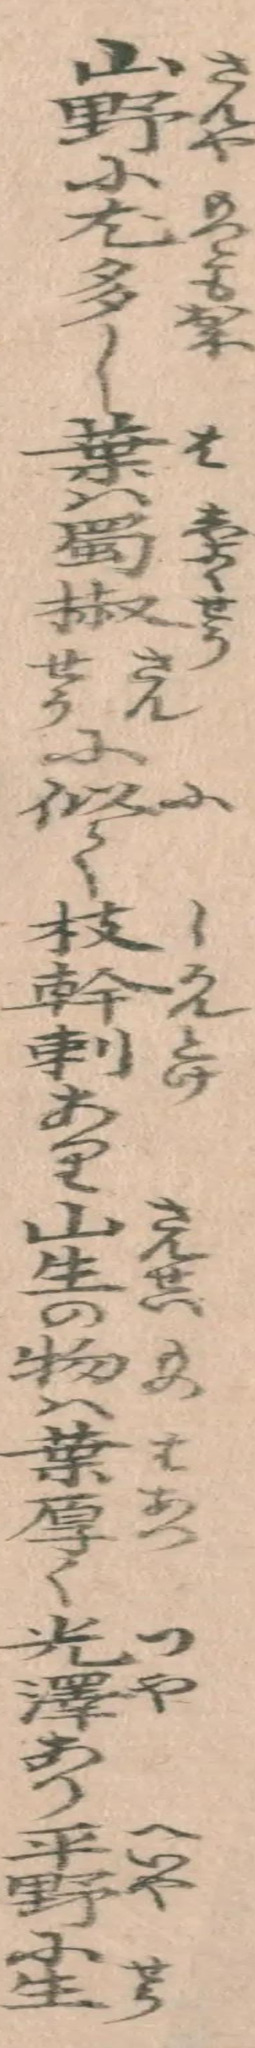山野に尤多し葉は蜀椒さんせうに似て枝幹剌あり山生の物は葉厚く光沢あり平野に生
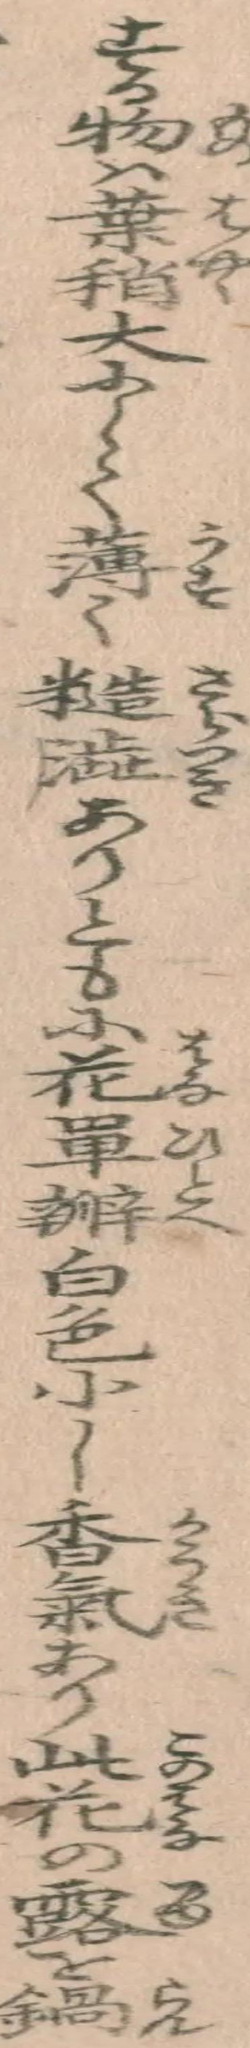する物は葉稍大にして薄く糙渋ありともに花単弁白色小し香気あり此花の露を鍋
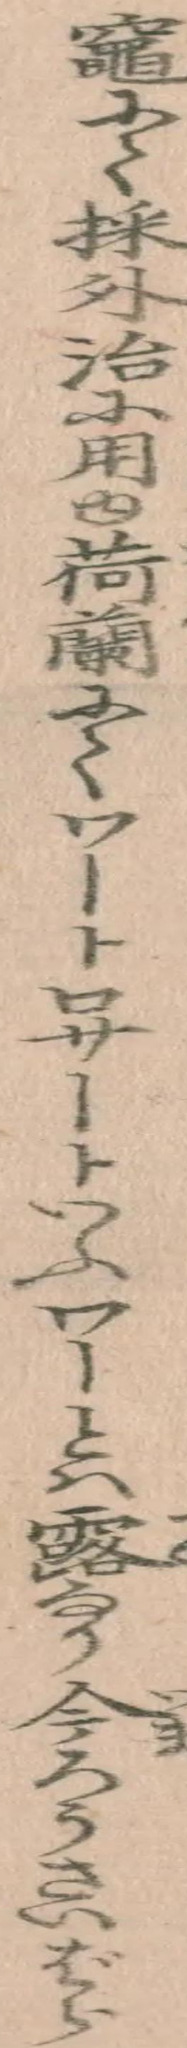竈にて採外治に用ゆ荷蘭にてワートロサートいふワーとは露なり今ろうさいばら
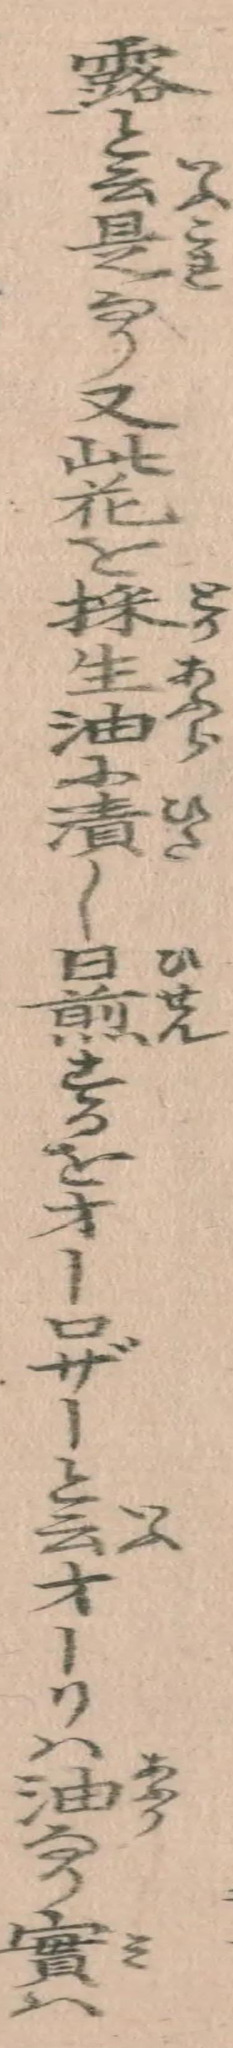露と云是なり又此花を採生油に漬し日煎するをオーロザーと云オーリは油なり実は
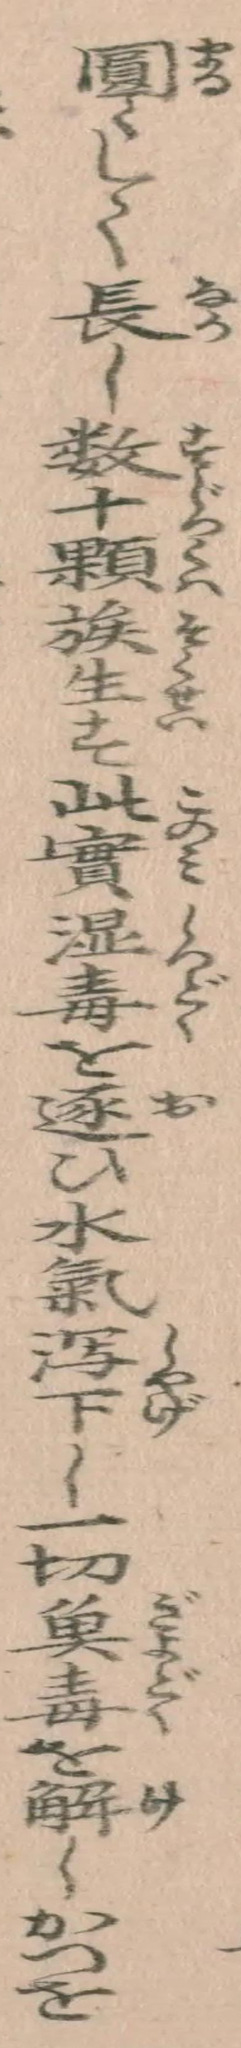円くして長し数十顆族生す此実湿毒を逐ひ水気瀉下し一切魚毒を解しかつを
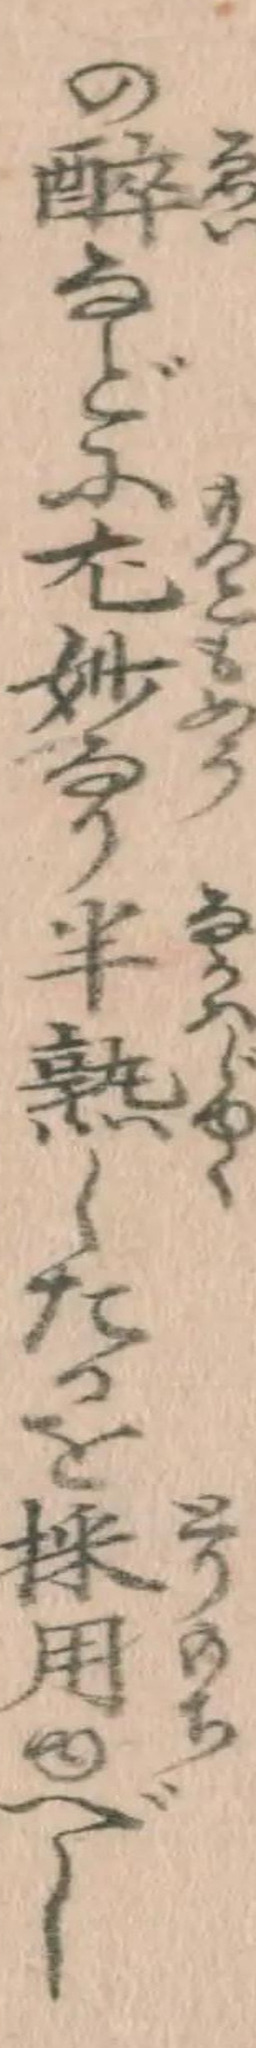の酔などに尤妙なり半熟したるを採用ゆべし

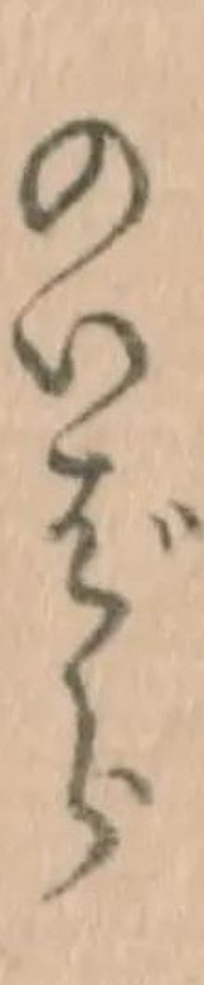のいばら
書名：本草図譜. 巻25-27
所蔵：国立国会図書館 National Diet Library, JAPAN
